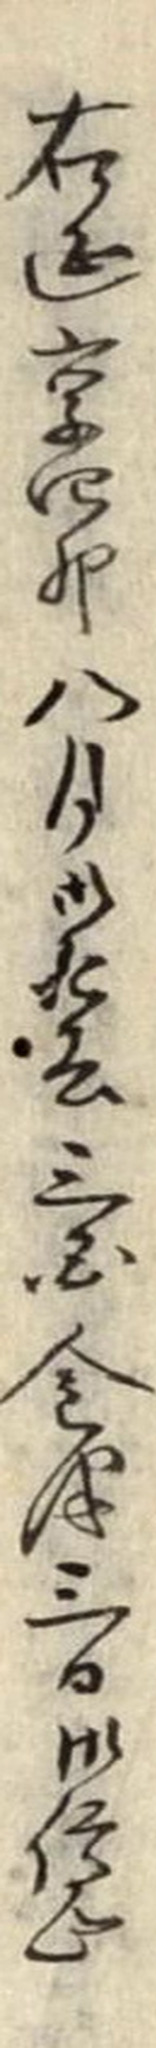右延享四卯八月御死去三国金津三日御停止
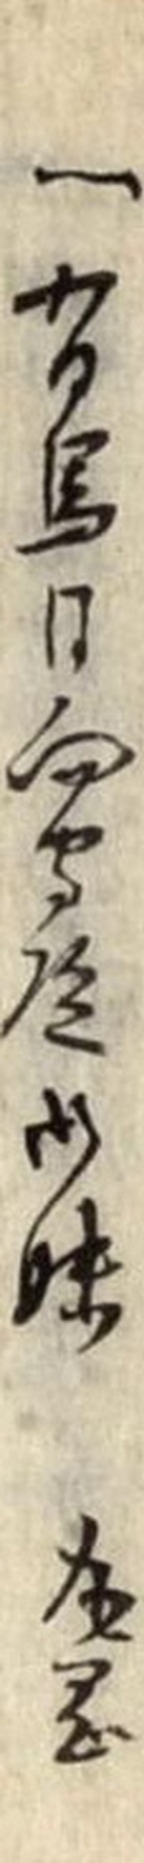一有馬日向守殿御妹丸岡
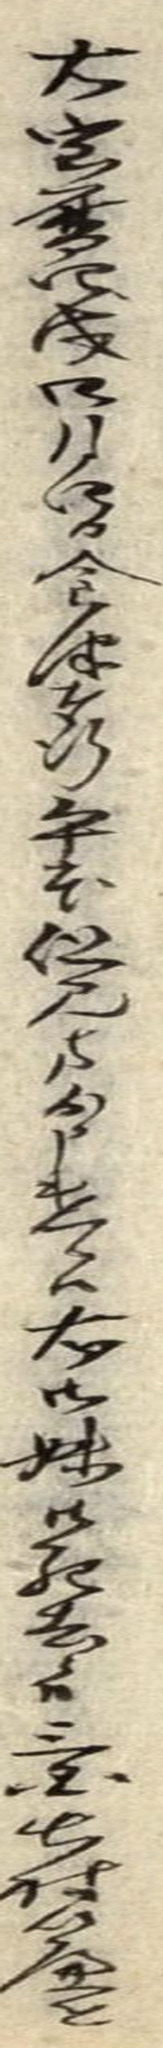右宝暦四戌四月四日金津奉行平本但見方ゟ申遣候は右御妹御死去に付三国出村簾を
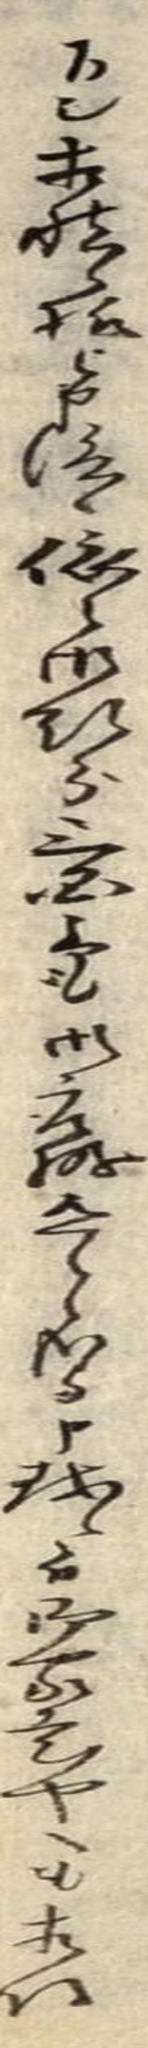下シ相慎候様被申渡候依之御領分三国にても御取扱有之候哉と申越候に付御家老中へも相伺
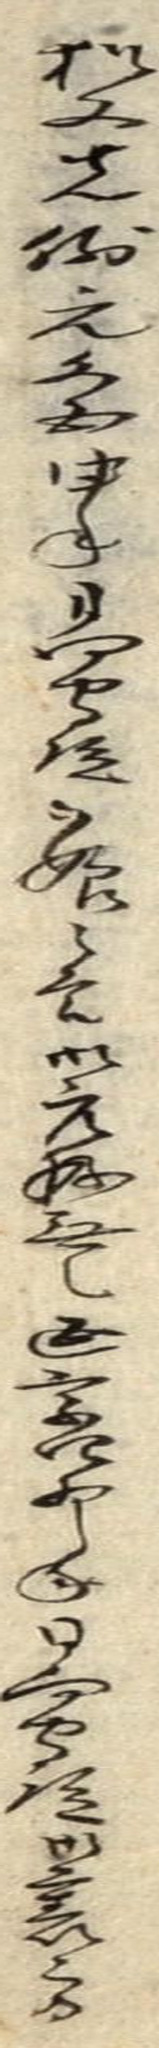猶又先例元文五申年日向守殿御娘之節御取扱無之延享四卯年日向守殿御裏方
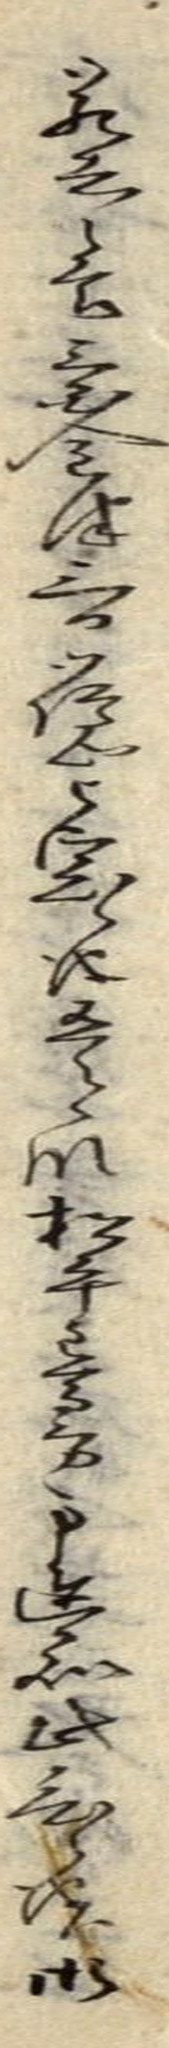御死去之節三国金津三日御停止被仰出候儀有之候段松平主馬方へ申達候処此度之儀は御
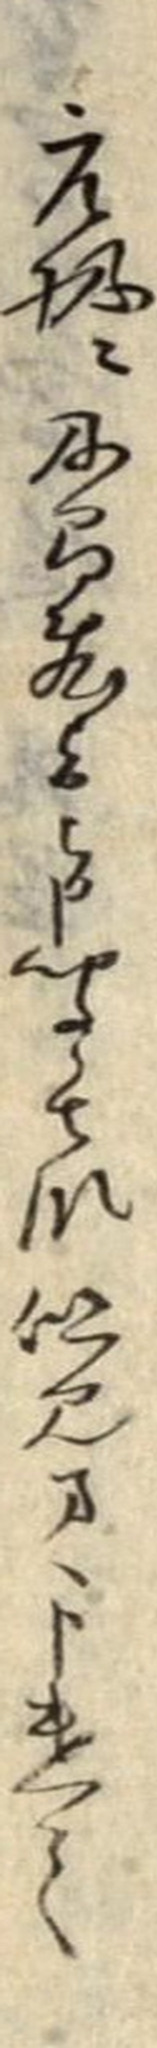取扱に及間敷旨被申聞其段但見方へ申遣之

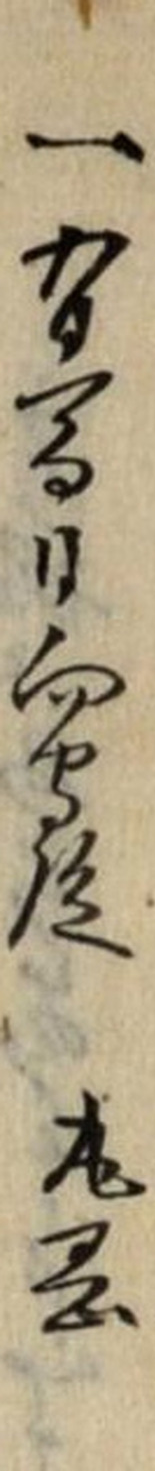一有馬日向守殿丸岡
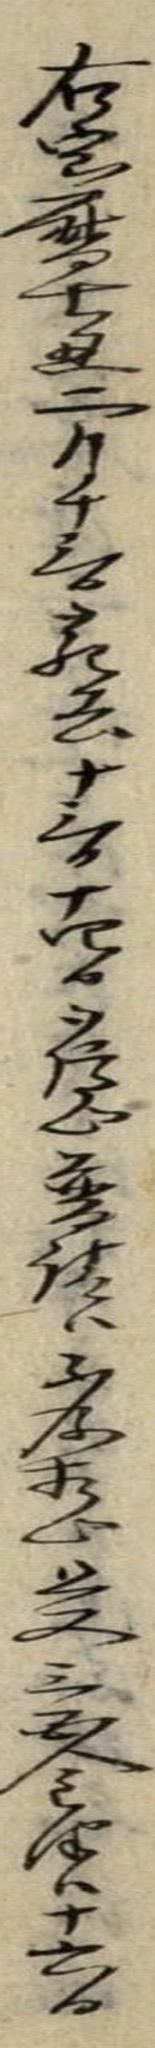右宝暦七丑二月十三日御死去十三日十四日御停止普請は不及相止且又三国金津は十六日
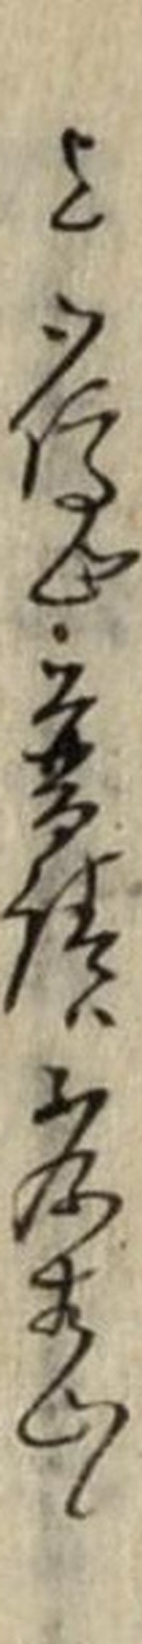迄御停止普請は不及相止候
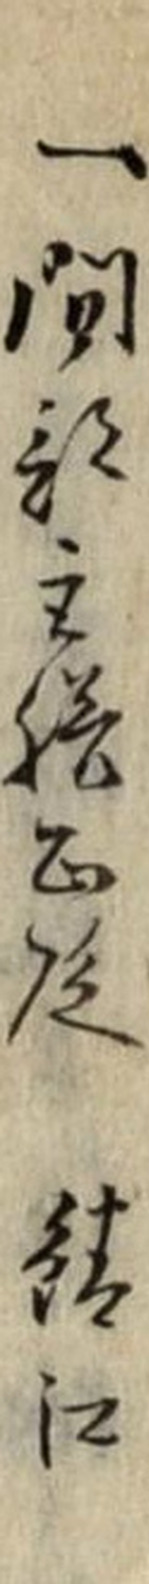一間部主膳正殿鯖江
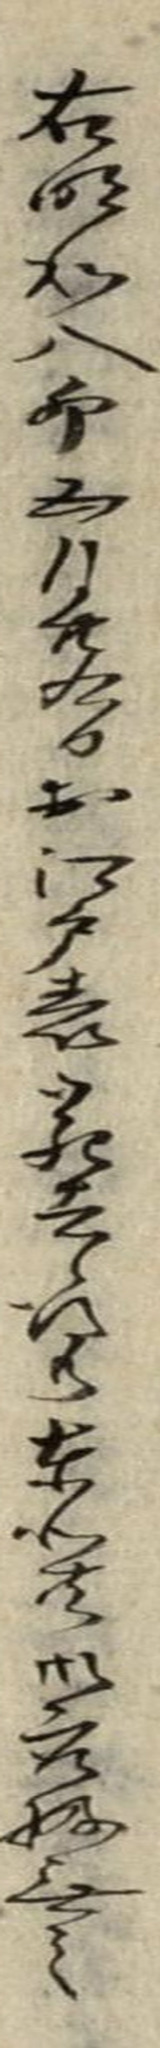右明和八卯正月廿九日於江戸表御死去候得共東北共御取扱無之
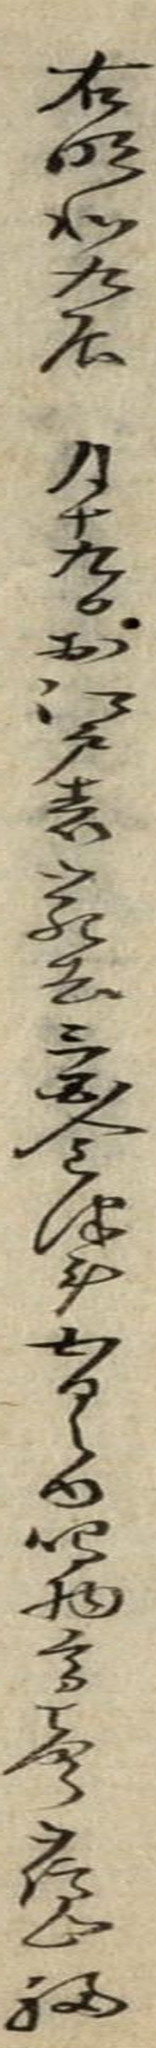右明和九辰月十九日於江戸表御死去三国金津斗五日之内鳴物高声御停止福
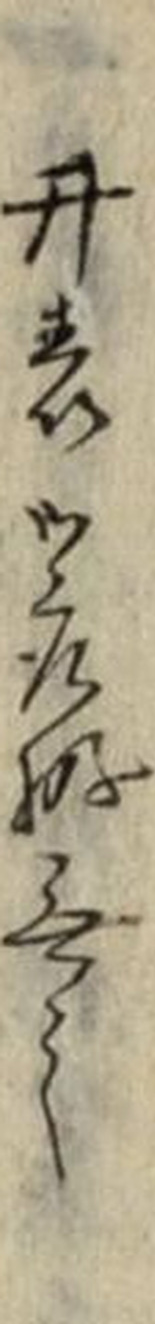井表御取扱無之
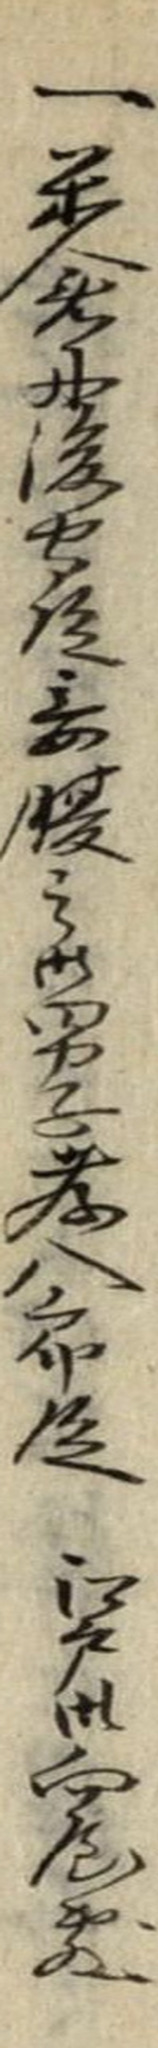一米倉丹後守殿妾腹之御男子孝八郎殿江戸御向屋敷
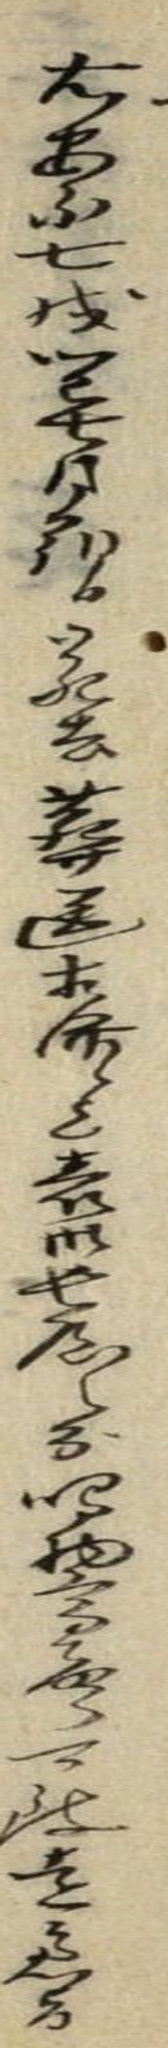右安永七戌閏七月朔日御死去葬送相済候迄表御長屋之分鳴物高声可致遠慮旨
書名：御停止異変死失
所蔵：福井県文書館 Fukui Prefectural Archives
